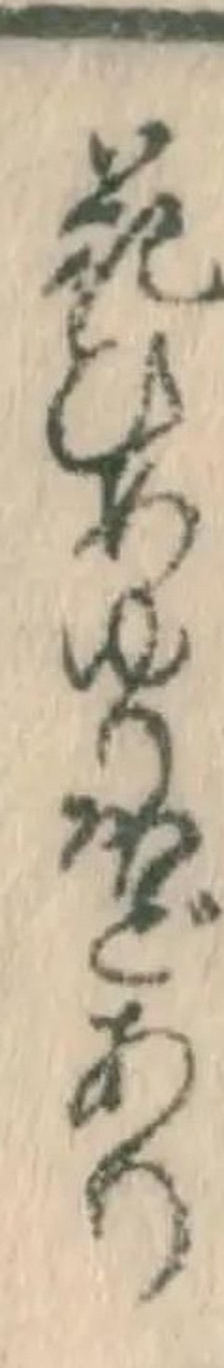花ひめゆりほどあり
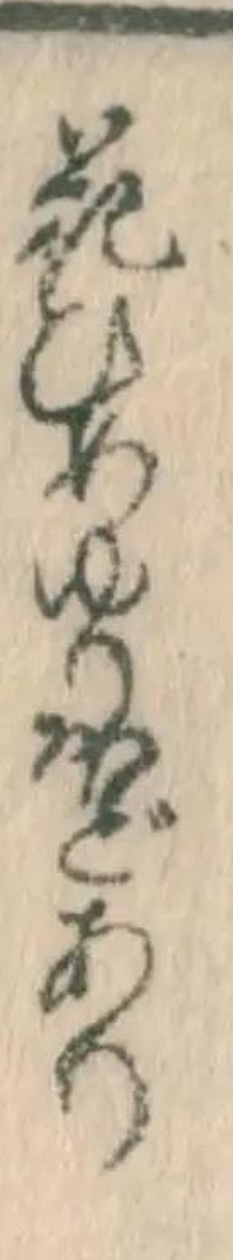花ひめゆりほどあり
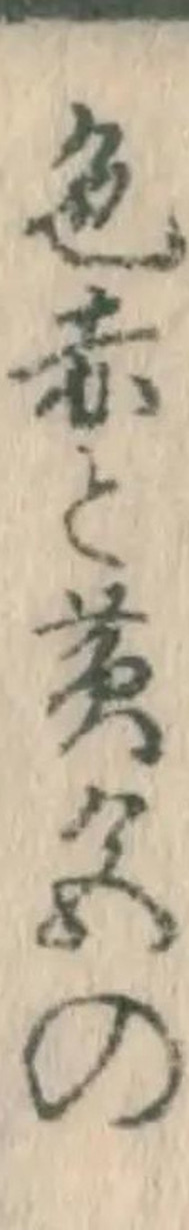色赤と黄色の
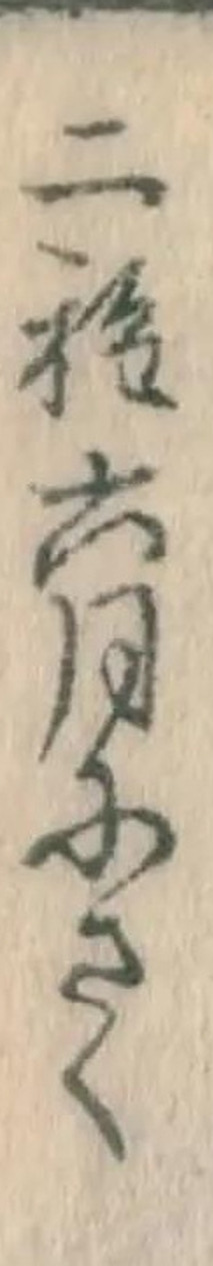二種六月にさく
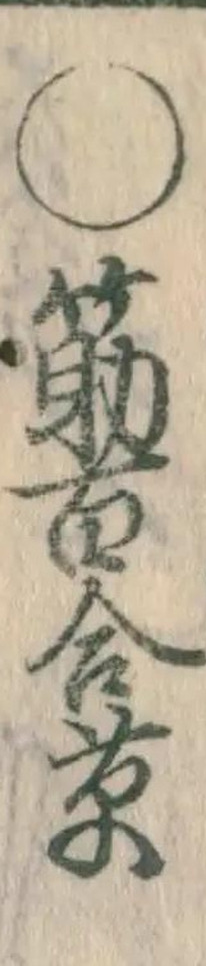〇筋百合草
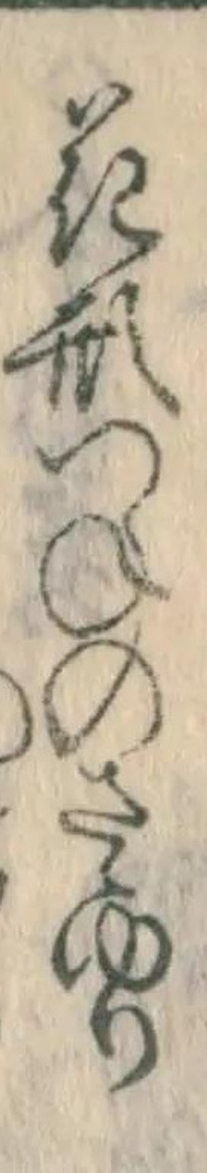花形つねのさゆり
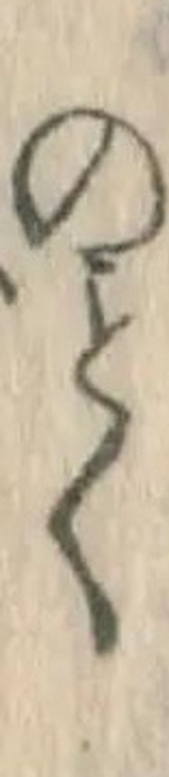のことく
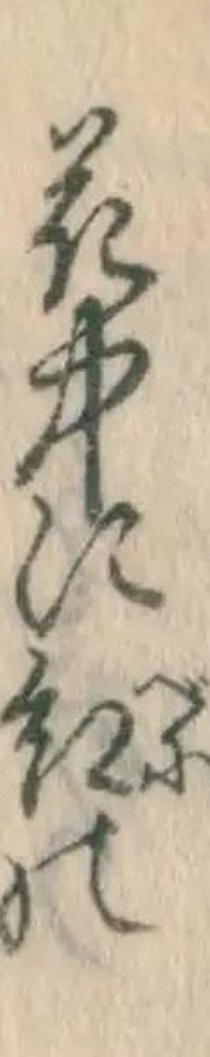花中に紅の
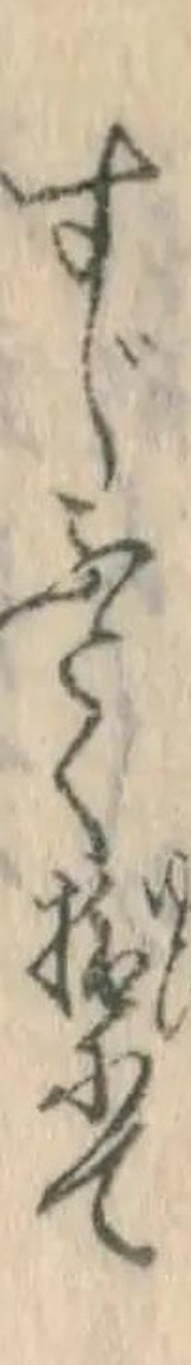すじふとく指にあり
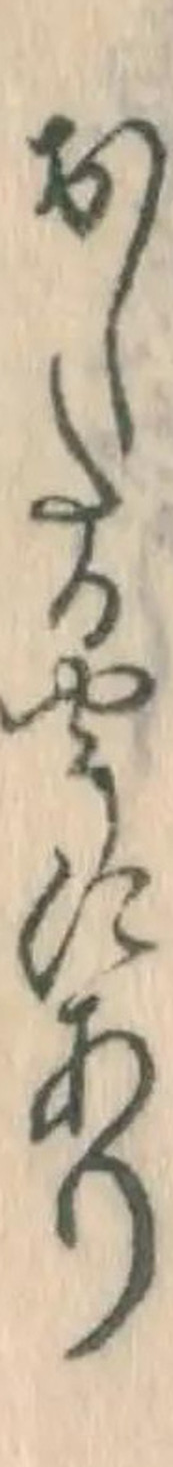おしたるやうにあり
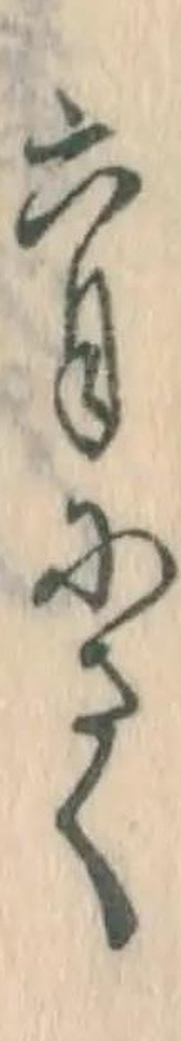六月にさく

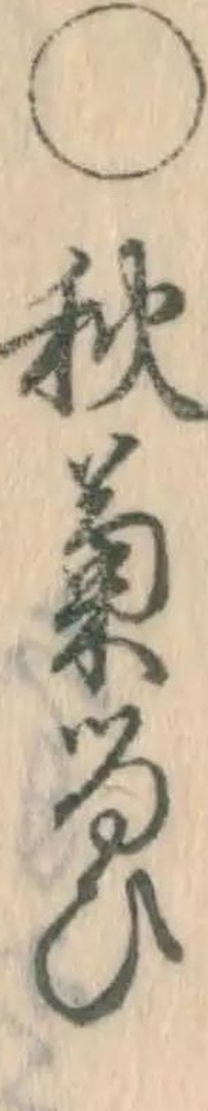〇秋菊るひ
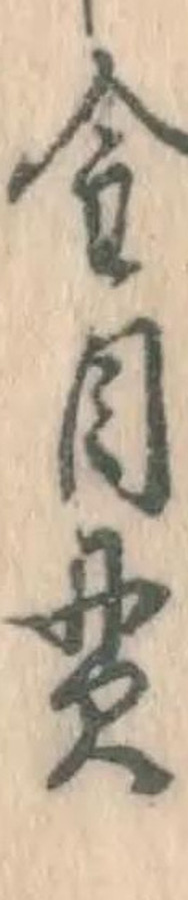金目貫
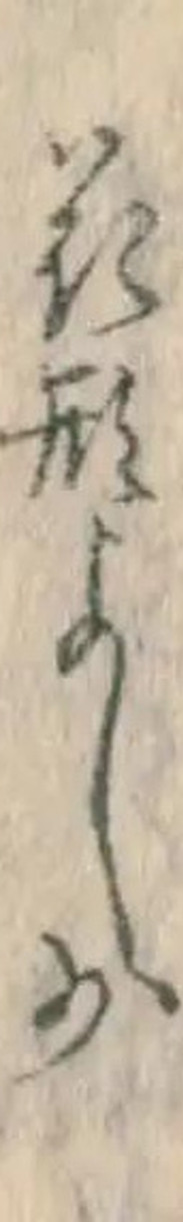花形よし少
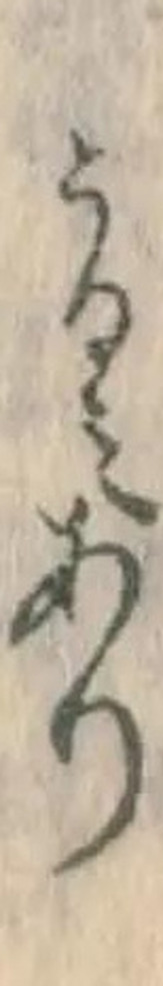うるみあり
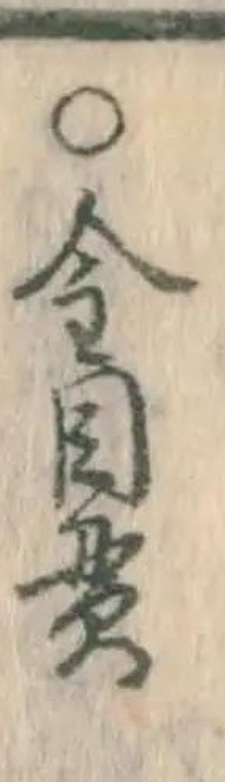〇金目貫
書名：艸花繪前集. [3]
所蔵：国立国会図書館 National Diet Library, JAPAN
